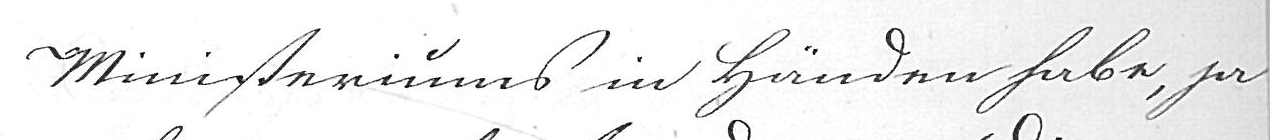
Minsteriums in Händen habe, ja
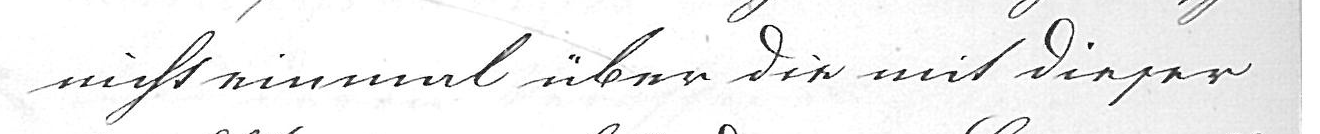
nicht einmal über die mit dieser
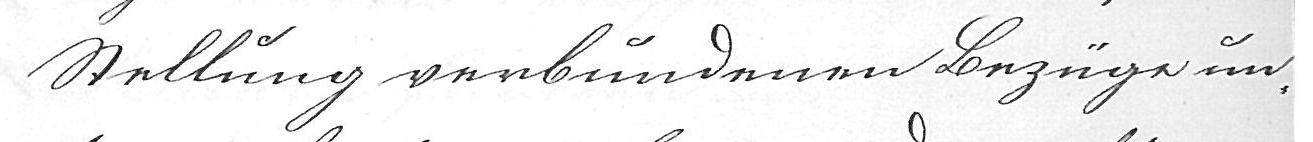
Stellung verbundenen Bezüge un-
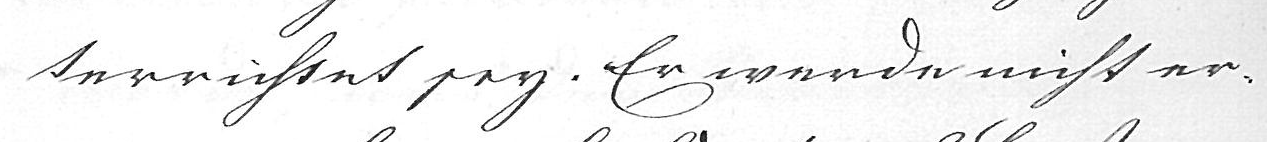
terrichtet sey. Er wende nicht er-
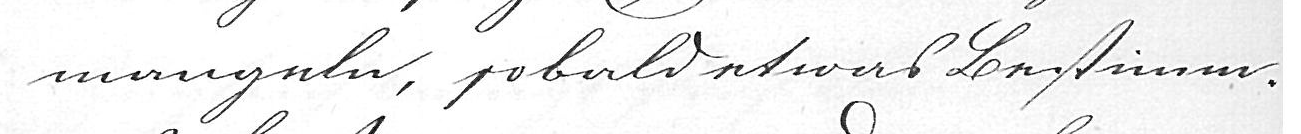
mangeln, sobald etwas Bestimm-
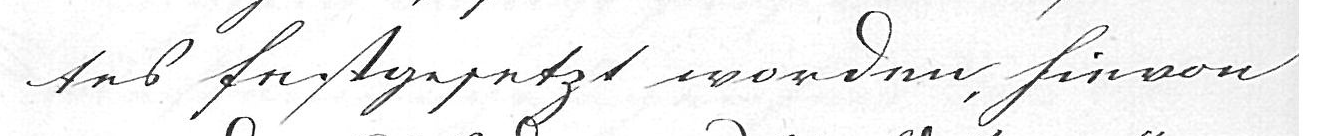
tes festgesetzt worden, hievon
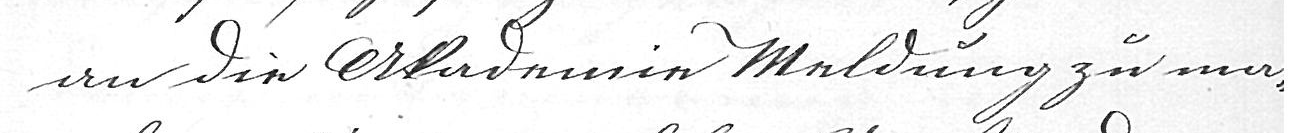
an die Akademie Meldung zu ma-
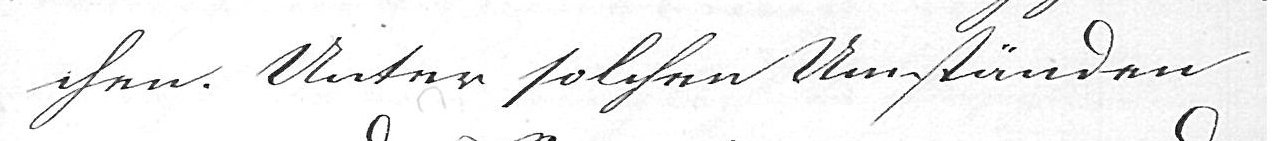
chen. Unter solchen Umständen
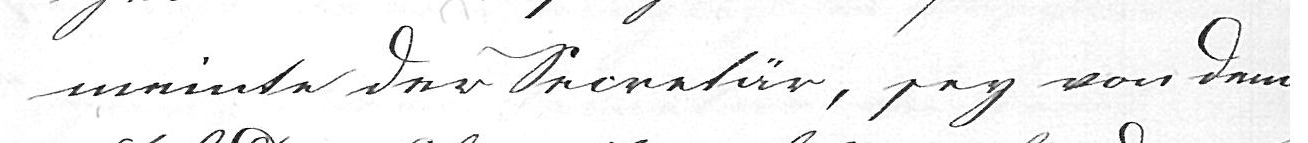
meinte der Secretär, sey von dem
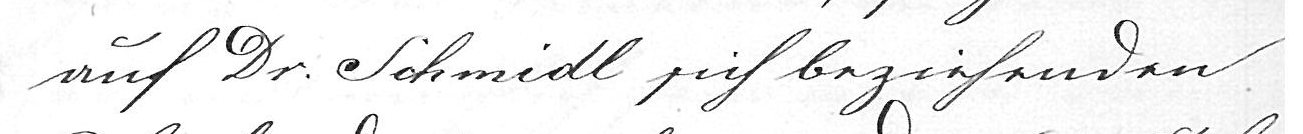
auf Dr. Schmidl sich beziehenden
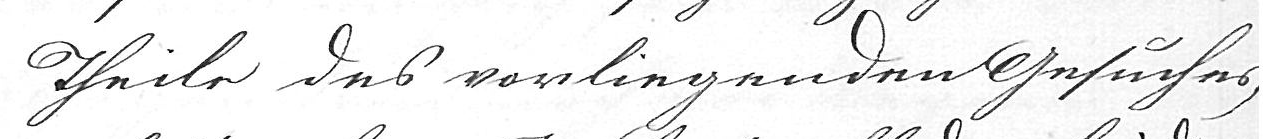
Theile des vorliegenden Gesuches,
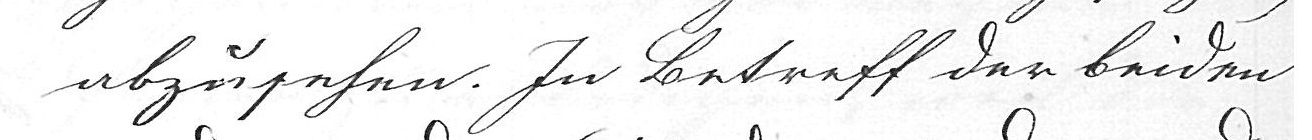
abzusehen. In Betreff der beiden
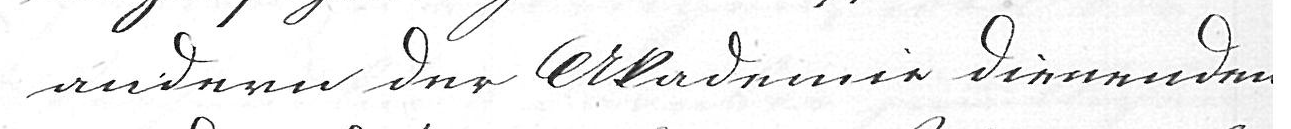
andern der Akademie dienenden
